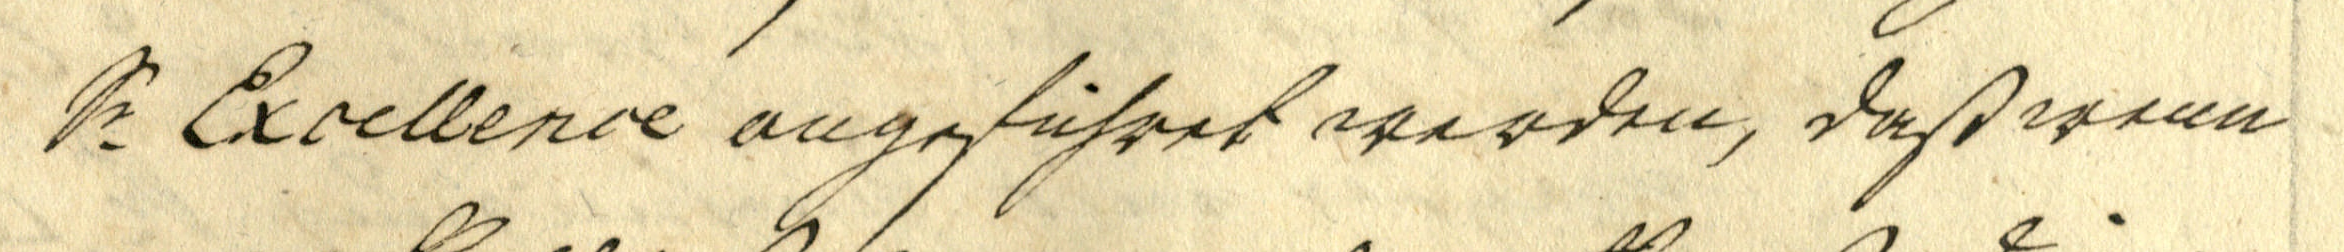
Sr Excellence angeführet werden, daß wenn
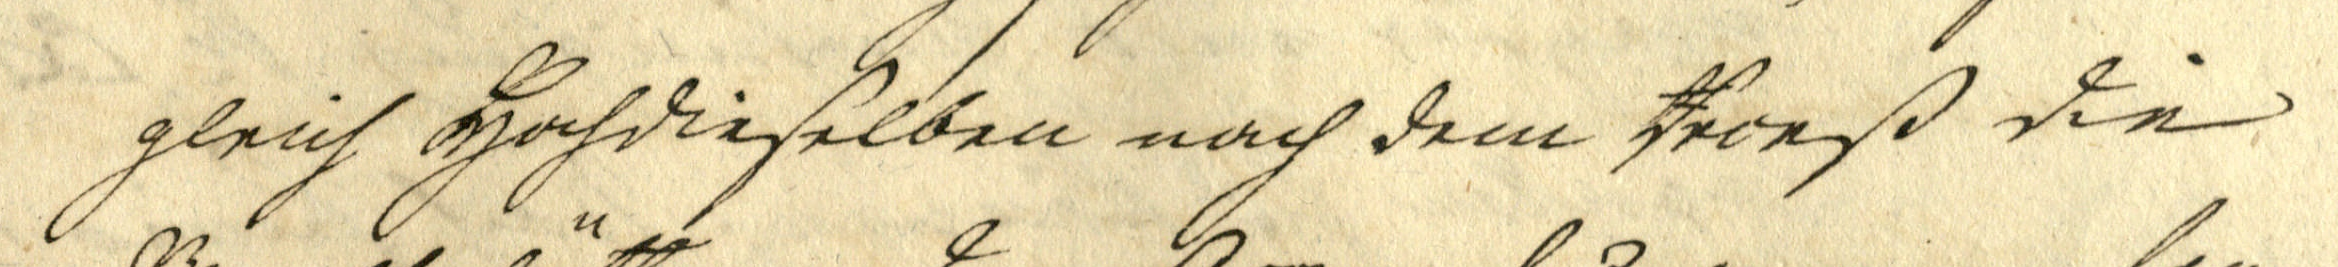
gleich Hochdieselben nach dem Receß die
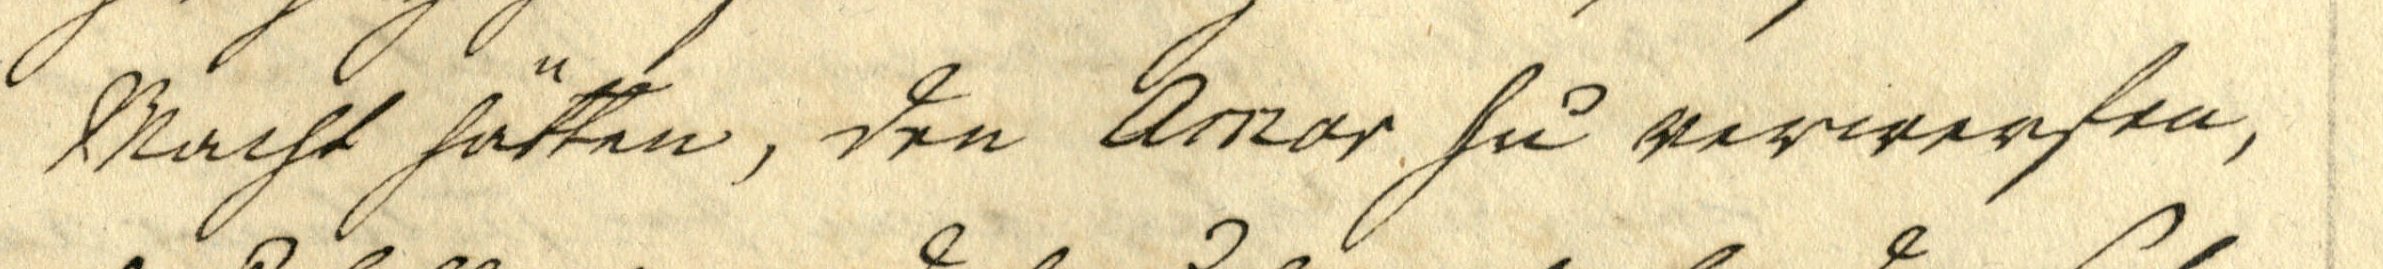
Macht hätten, den Amor zu verwerfen,
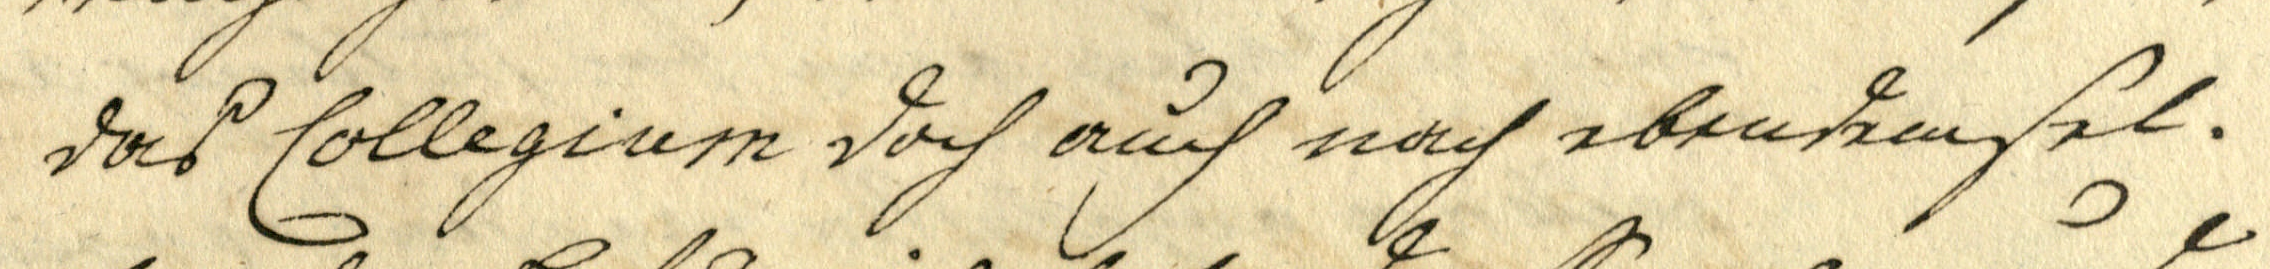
das Collegium doch auch nach ebendemsel¬
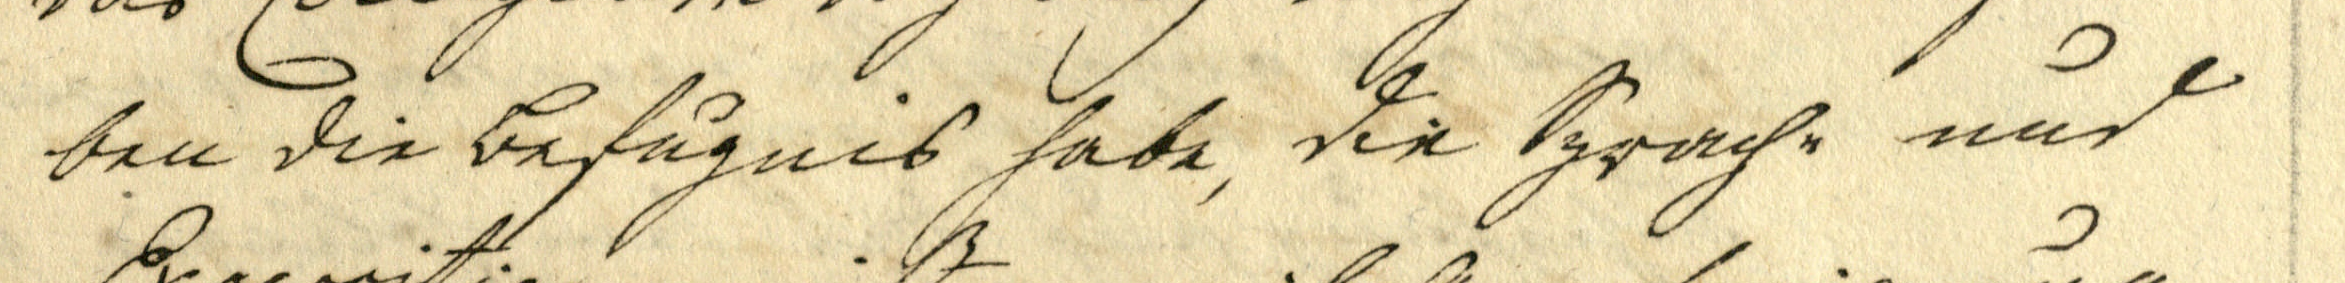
ben die Befugnis habe die Sprach- und
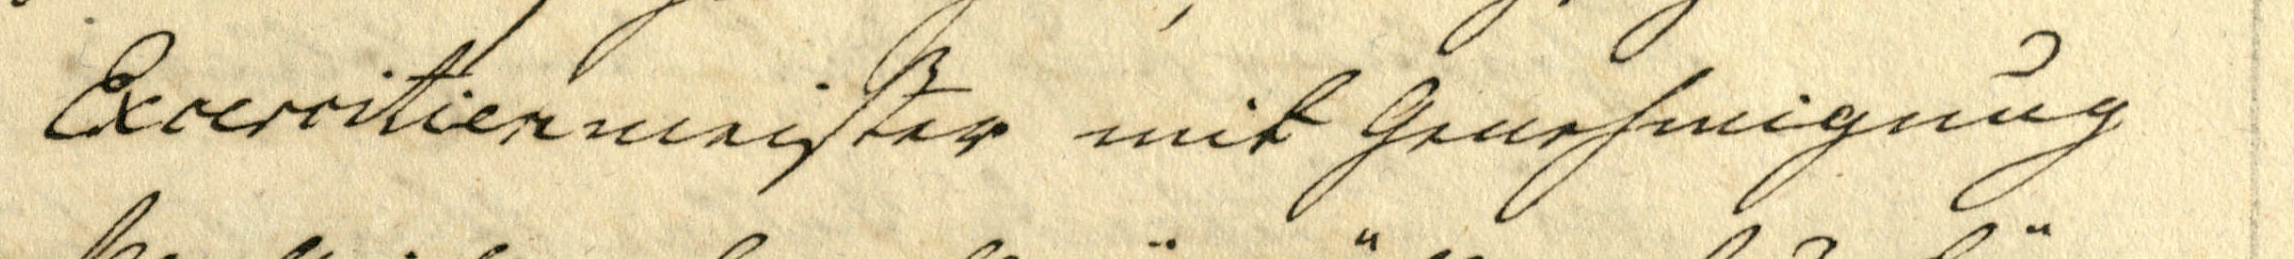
Excercitienmeister mit Genehmigung
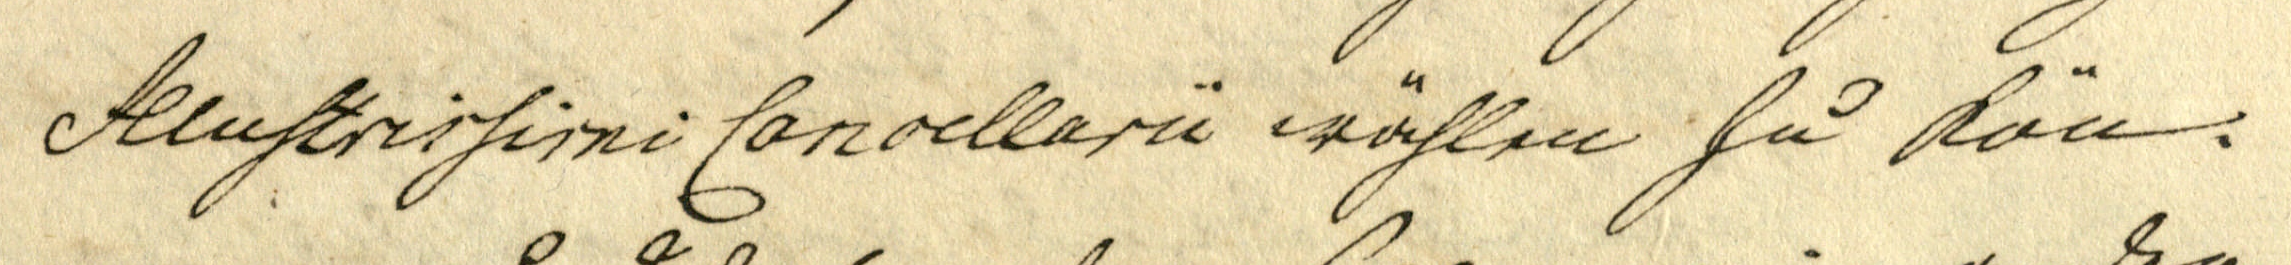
Illustrissimi Cancellarii wählen zu kön¬
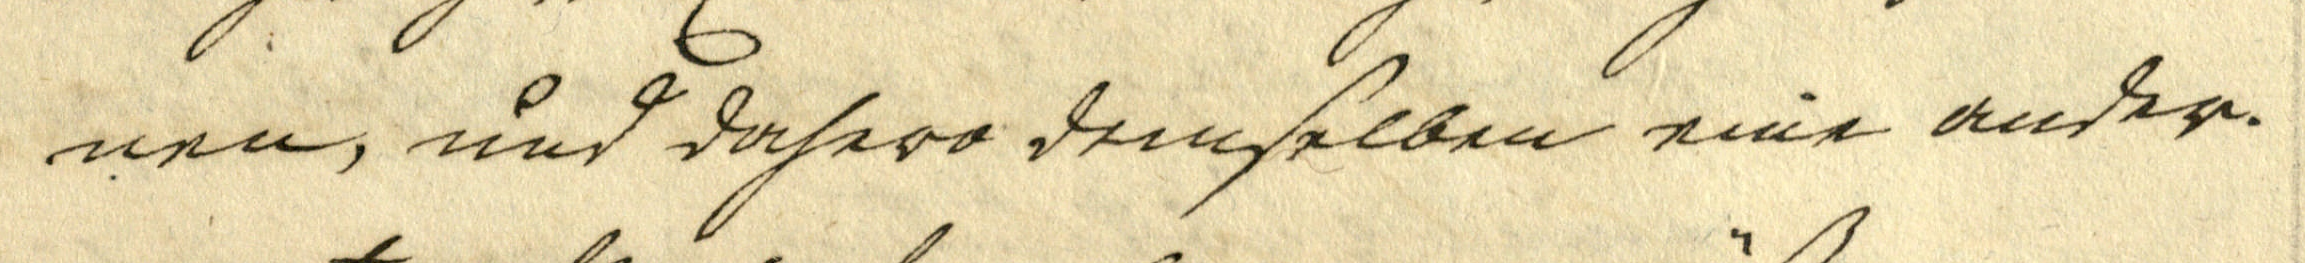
nen, und dahero demselben eine ander¬
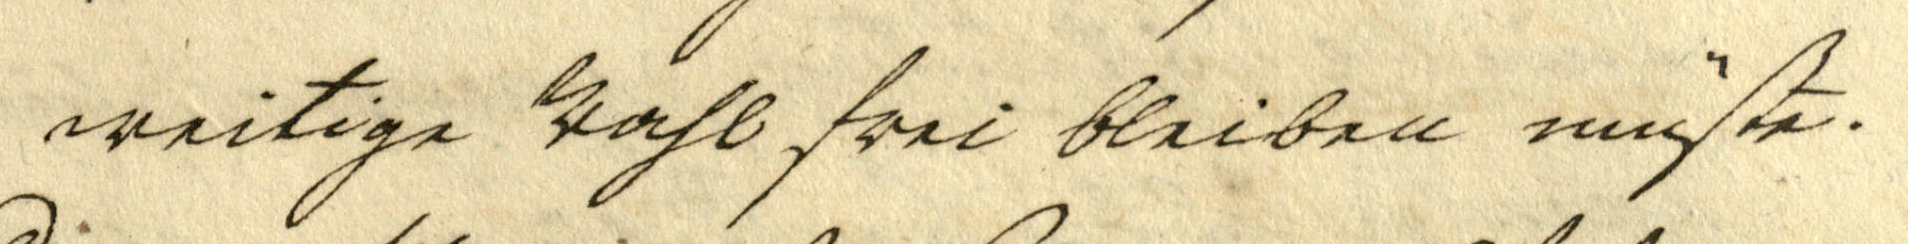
weitige Wahl frei bleiben müßte.
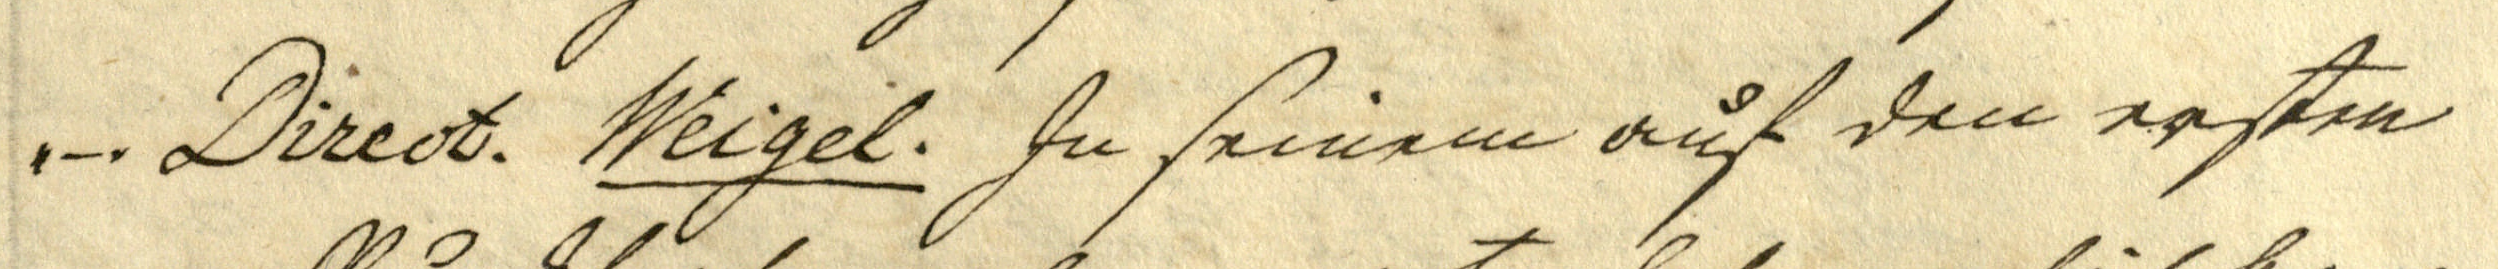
Direct. Weigel. In seinem auf den ersten
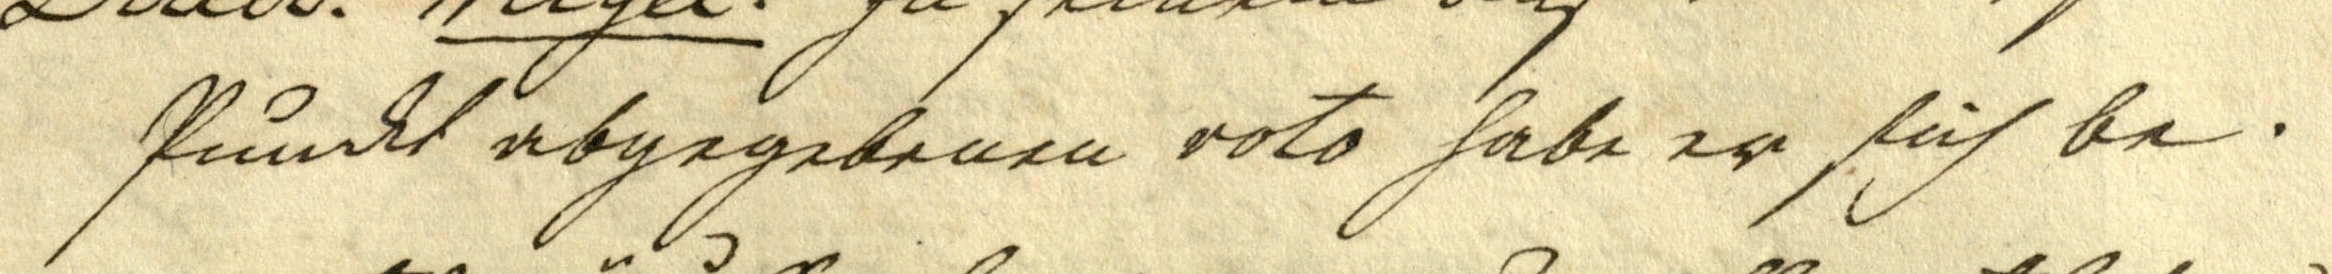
Punckt abgegebenen voto habe er sich be¬
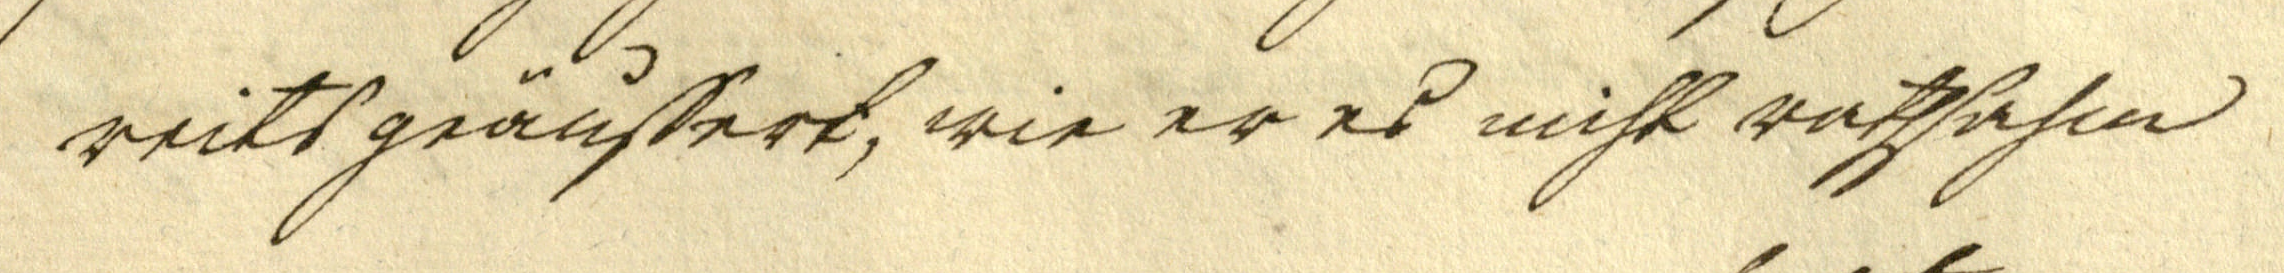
reits geäussert, wie er es nicht rathsahm
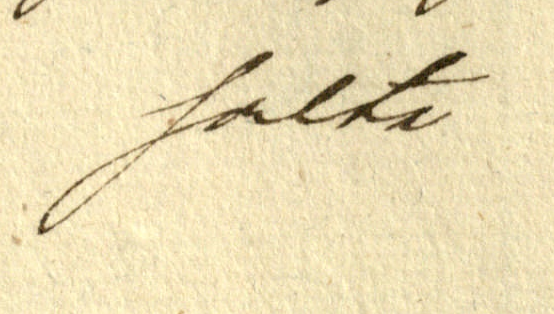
halte
